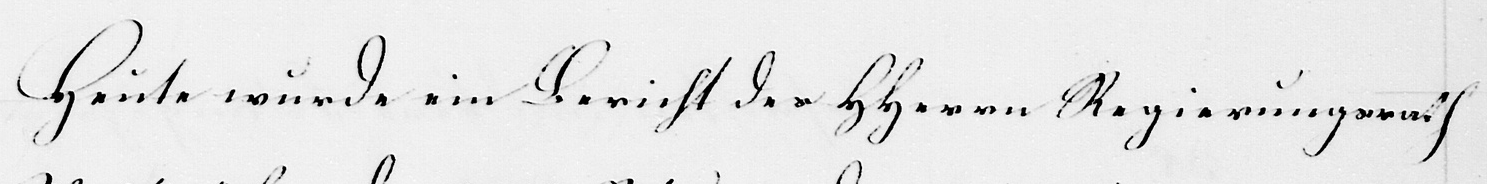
Heute wurde ein Bericht des HHerrn Regierungsrath
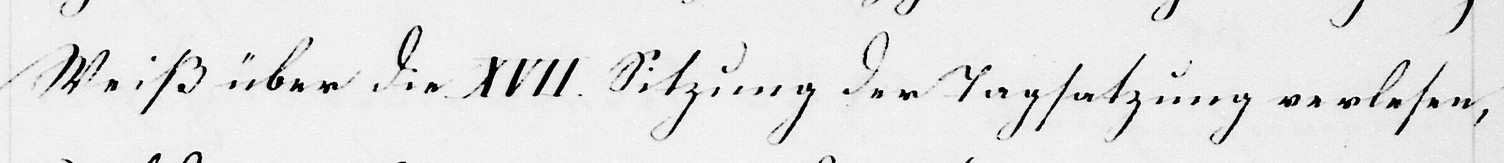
Weiß über die XVII. Sitzung der Tagsatzung verlesen,
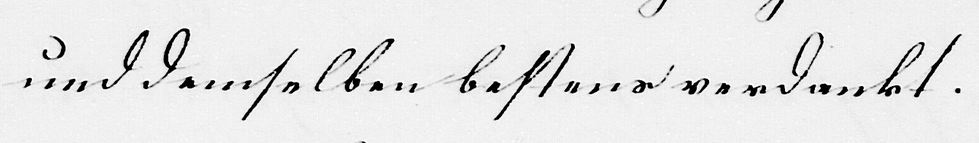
und demselben bestens verdankt.
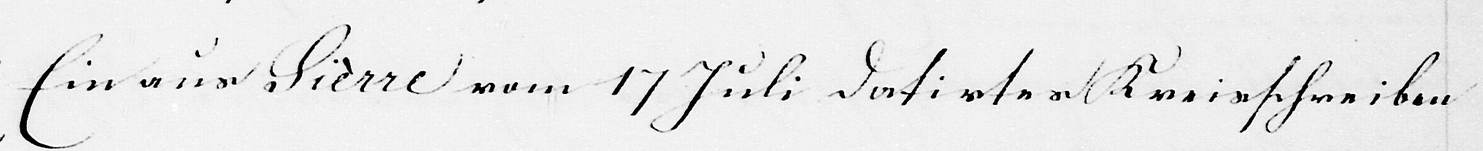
Ein aus Sièrre vom 17 Juli datirtes Kreisschreiben
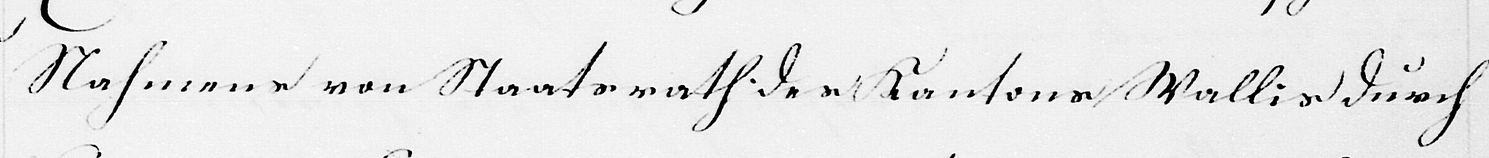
Nahmens von Staatsrath des Kantons Wallis durch
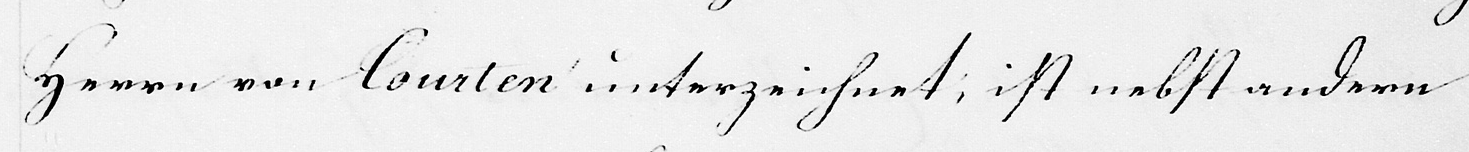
Herrn von Courten unterzeichnet, ist nebst andern
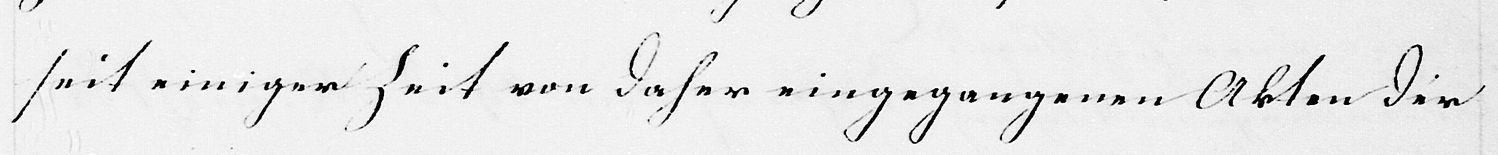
seit einiger Zeit von daher eingegangenen Akten der
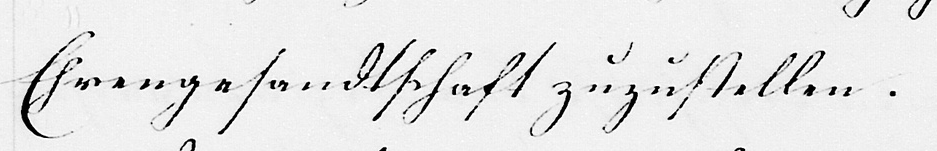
Ehrengesandtschaft zuzustellen.
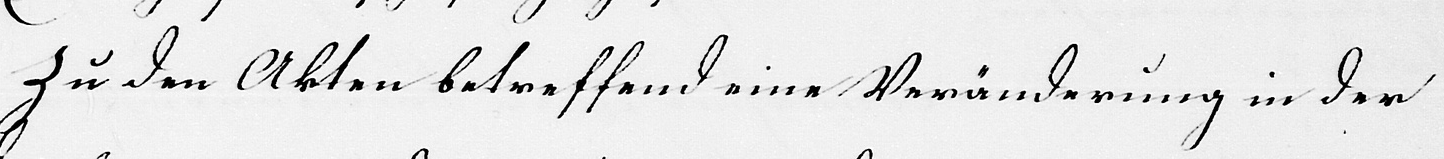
Zu den Akten betreffend eine Veränderung in der
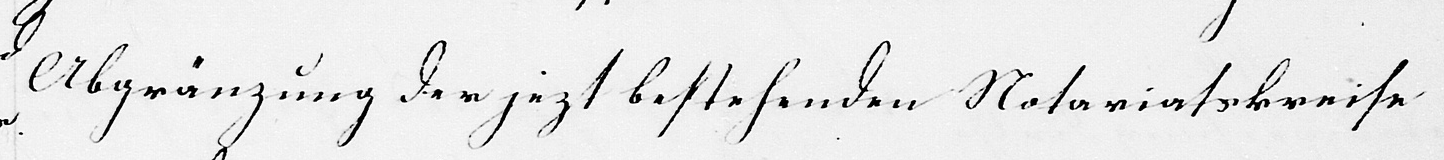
Abgränzung der jezt bestehenden Notariatskreise
